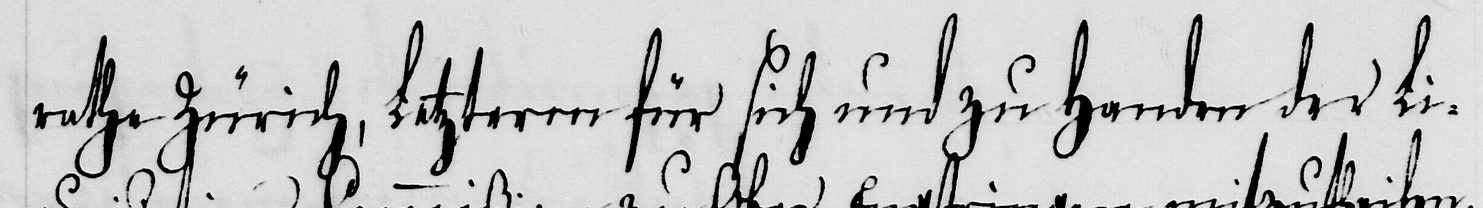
rathe Zürich, Letzterm für sich und zu Handen der Li¬
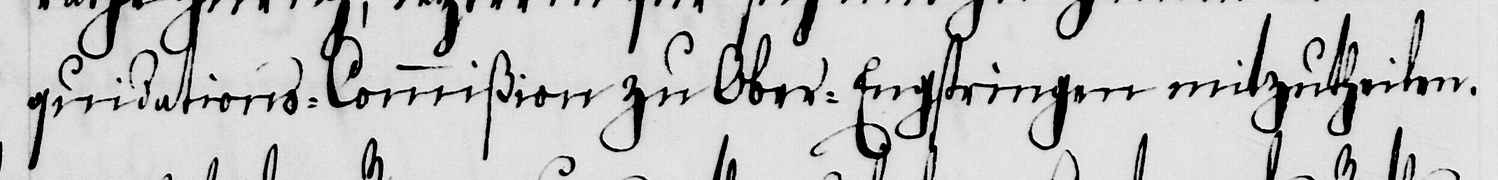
quidations-Commißion zu Ober-Engstringen mitzutheilen.
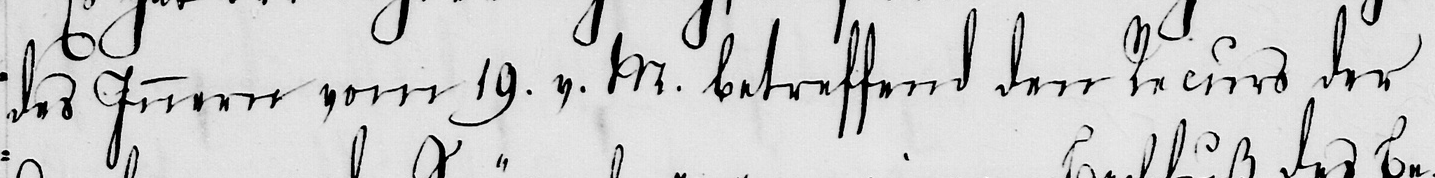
des Innern vom 19. v. M. betreffend den Recurs der
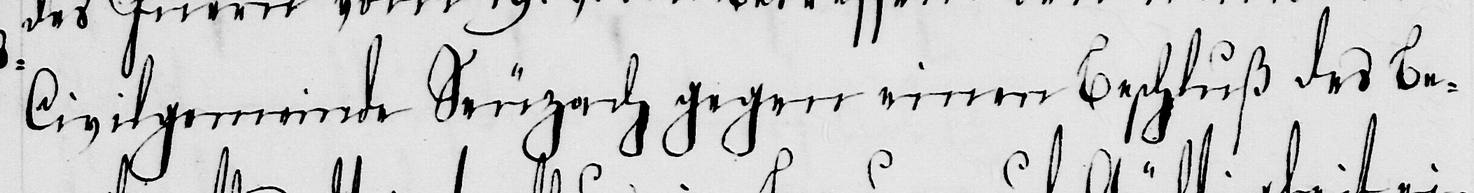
Civilgemeinde Seuzach gegen einen Beschluß des Be¬
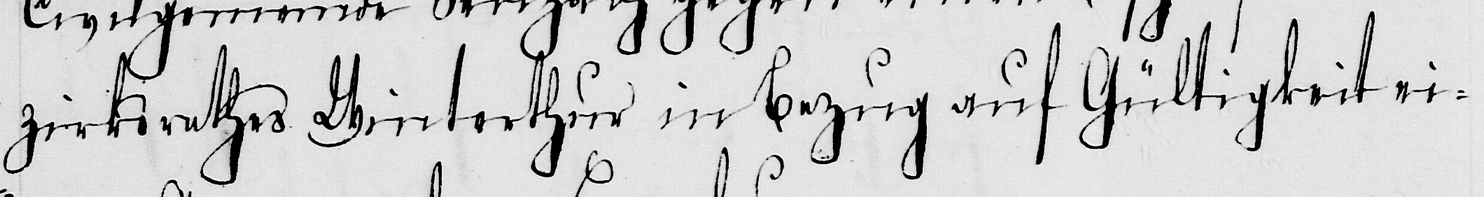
zirksrathes Winterthur in Bezug auf Gültigkeit ei¬
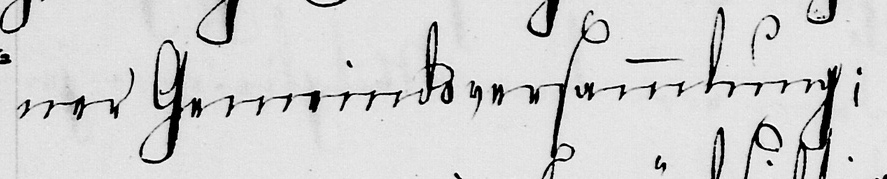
ner Gemeindsversammlung;
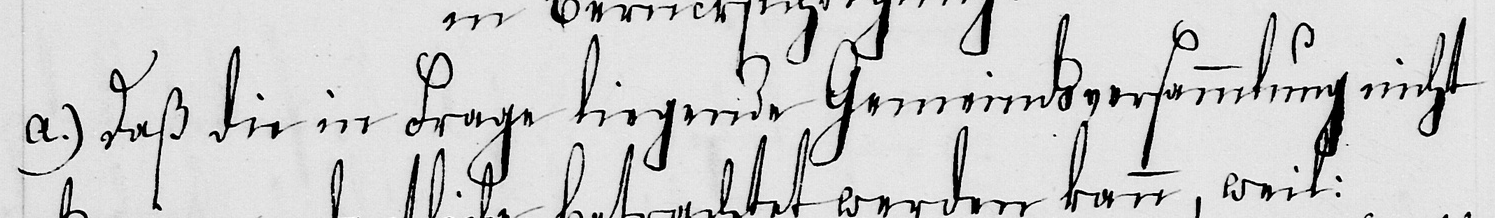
a.) Daß die in Frage liegende Gemeindsversammlung nicht
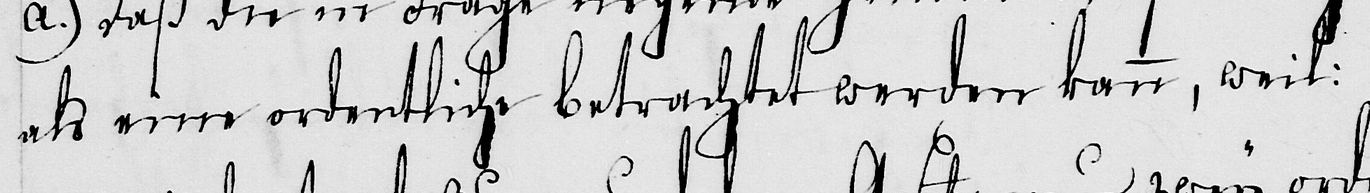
als eine ordentliche betrachtet werden kann, weil:
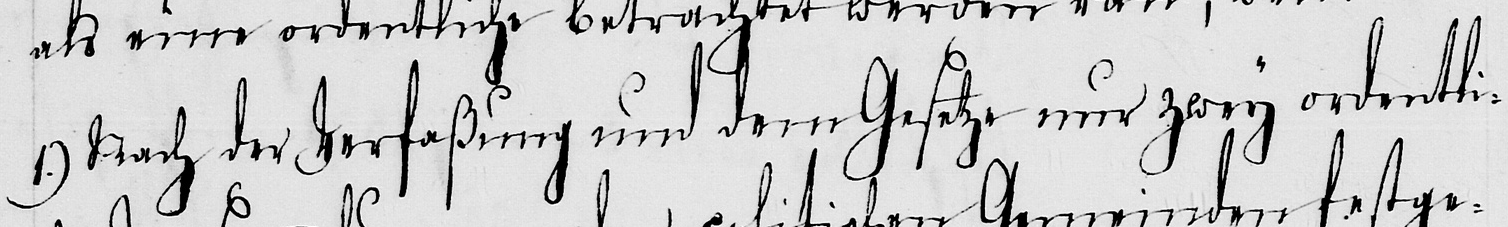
1.) Nach der Verfaßung und dem Gesetze nur zwey ordentli¬
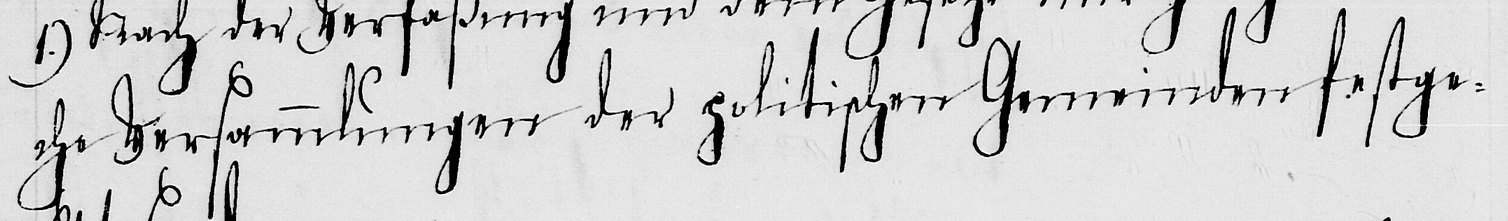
che Versammlungen der politischen Gemeinden festgese¬
